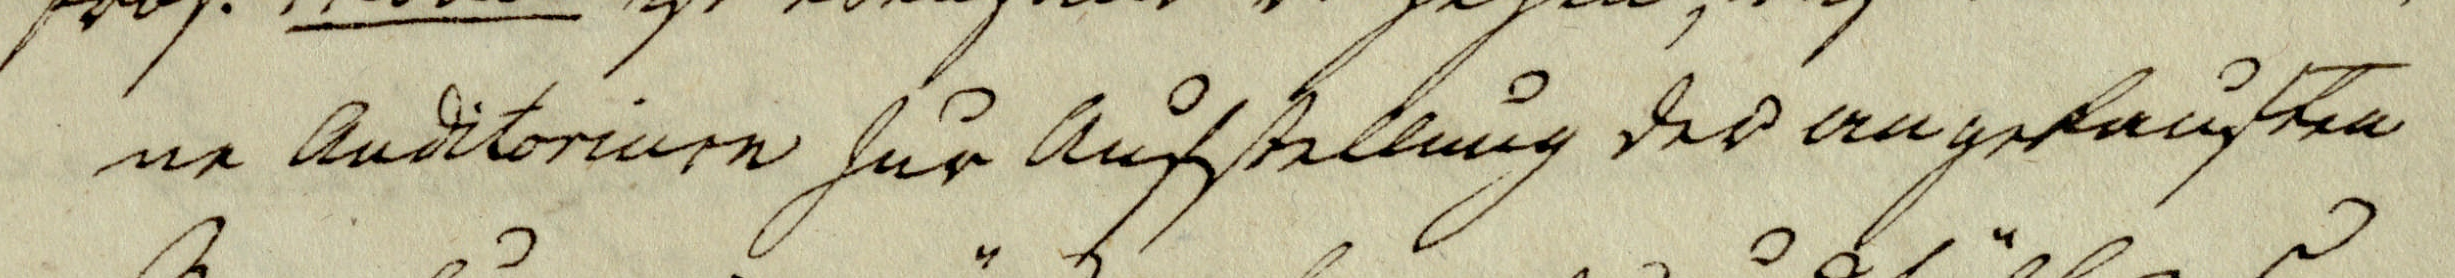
ne Auditorium zur Aufstellung der angekauften
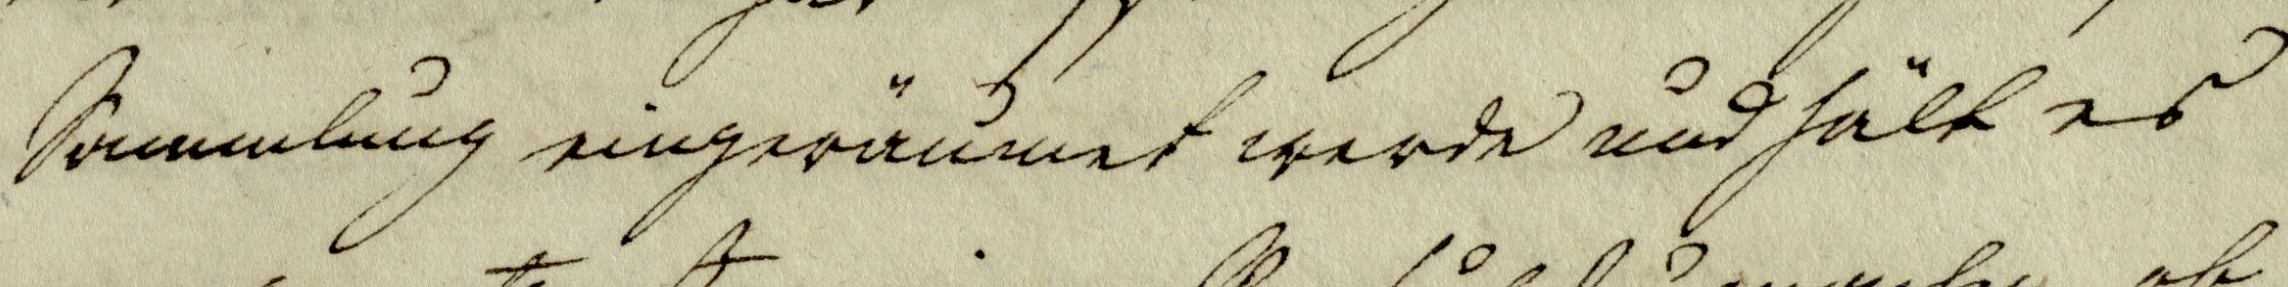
Sammlung eingeräumet werde und hält es
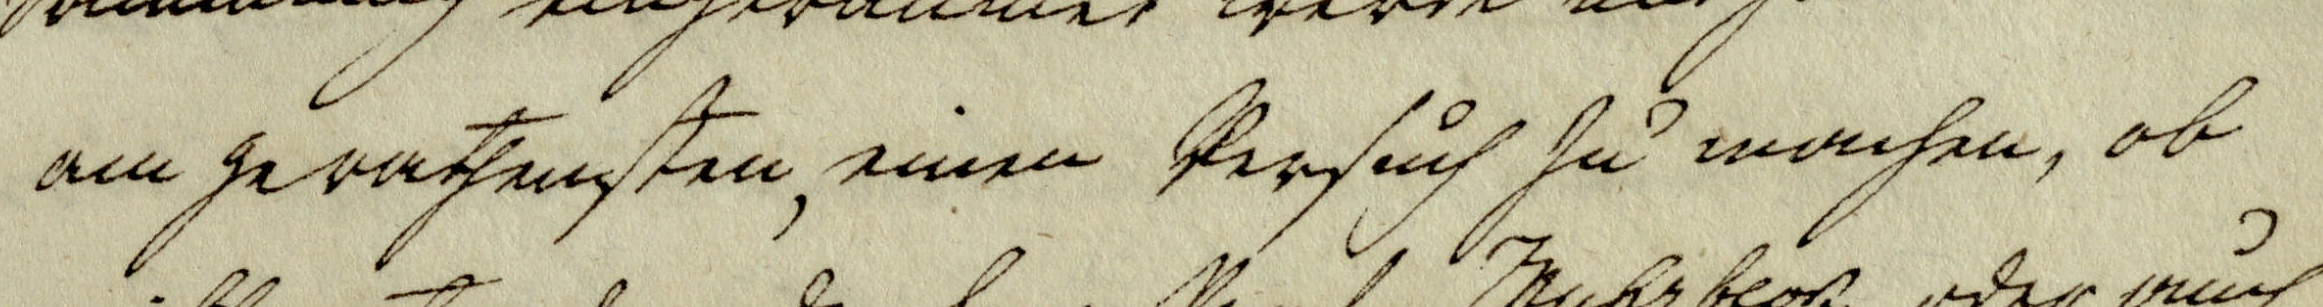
am gerathensten, einen Versuch zu machen, ob
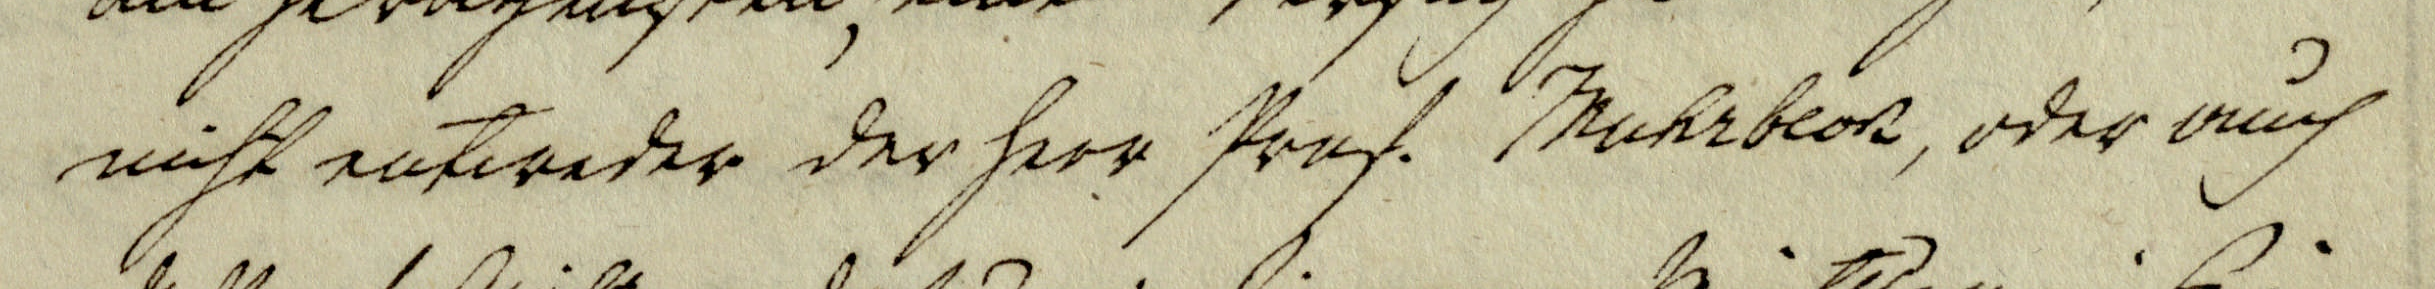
nicht entweder der Herr Prof. Muhrbeck, oder auch
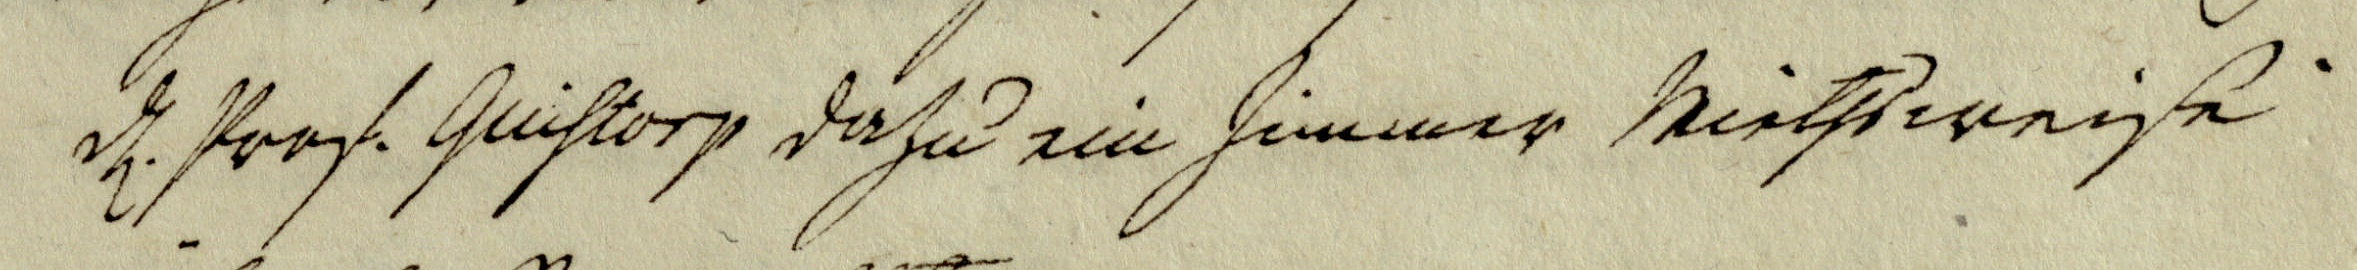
dh. Prof. Quistorp dazu ein Zimmer Miethsweise
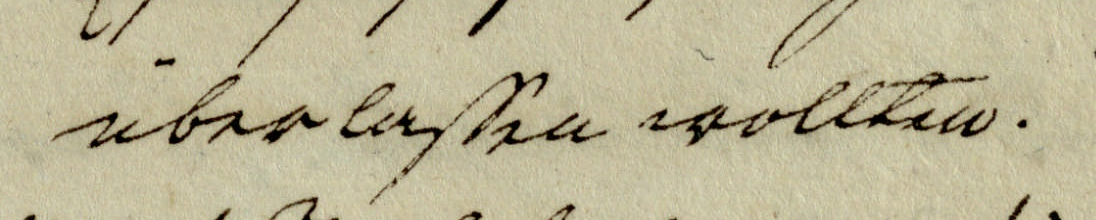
überlassen wollten.
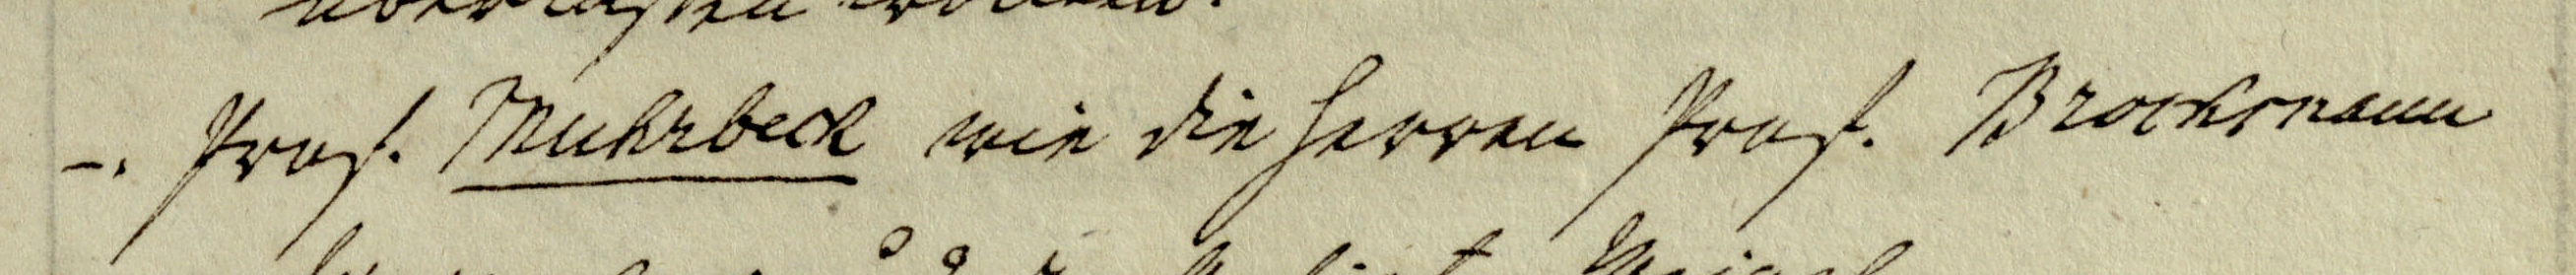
Prof. Muhrbeck wie die Herren Prof. Brockmann
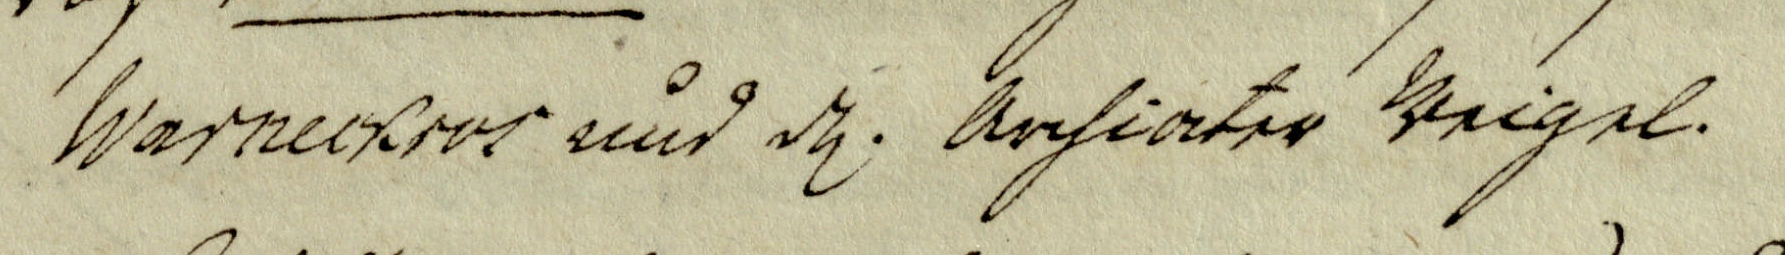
Warneckros und dh. Archiater Weigel.
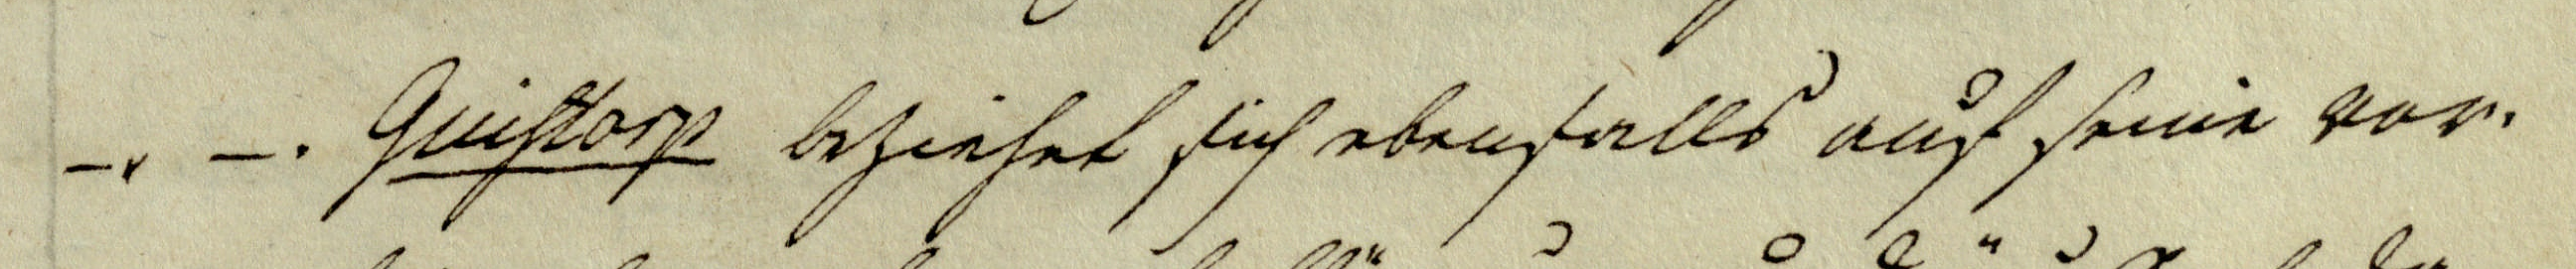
Quistorp beziehet sich ebenfalls auf seine vor¬
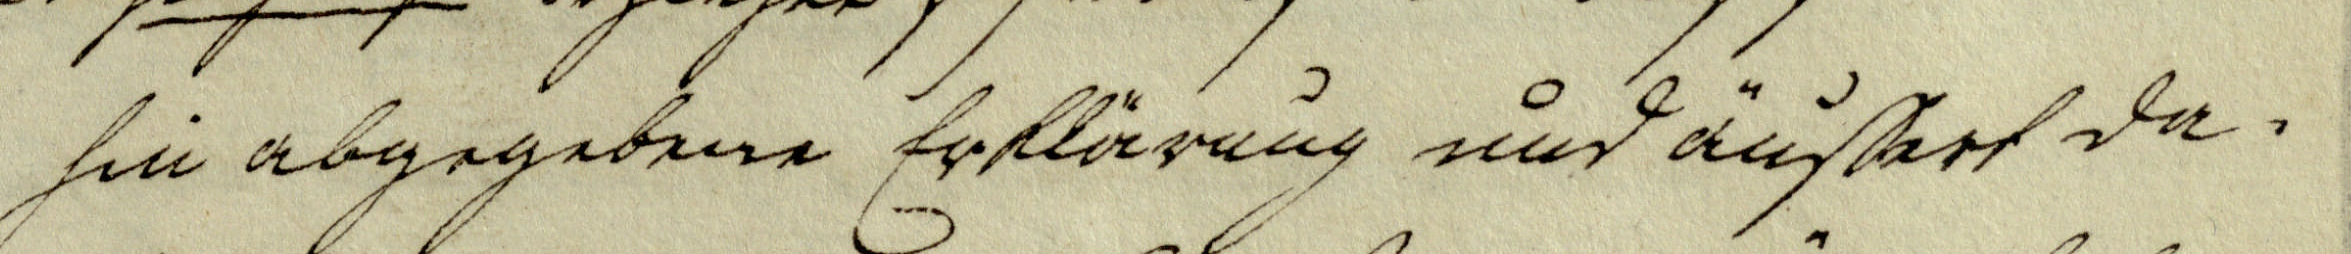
hin abgegebene Erklärung und äussert da¬
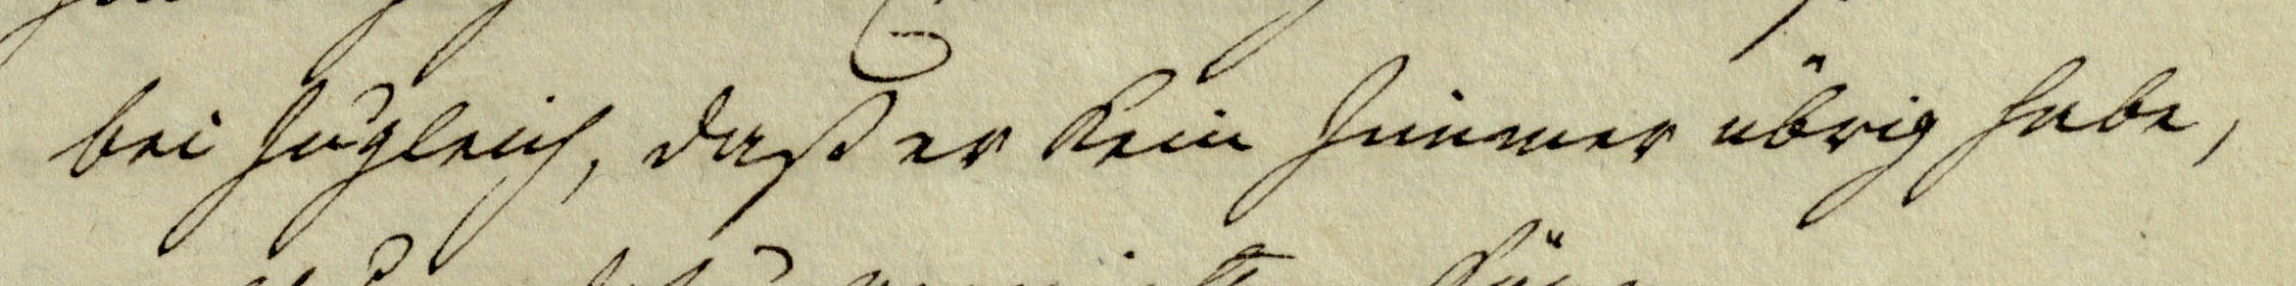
bei zugleich, daß er kein Zimmer übrig habe,
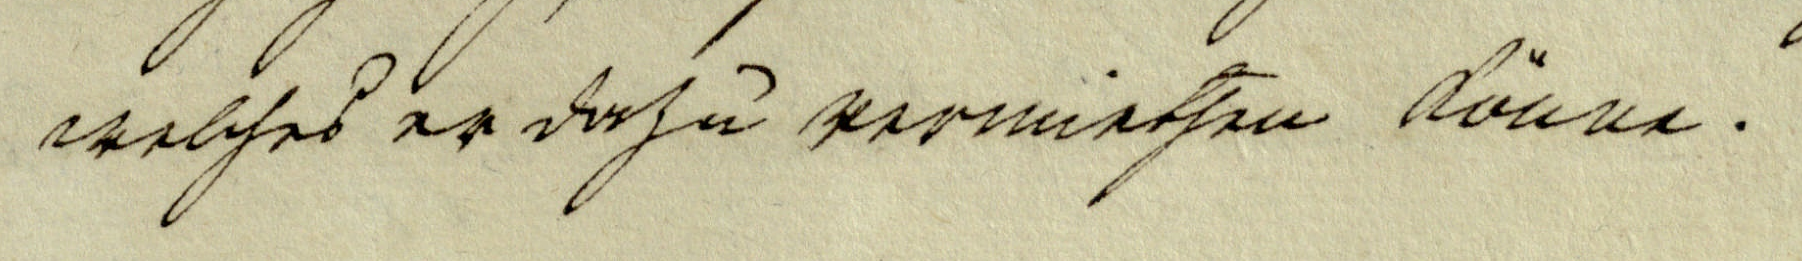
welches er dazu vermiethen könne.
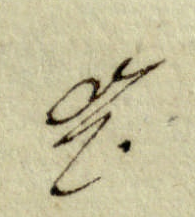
dh.
